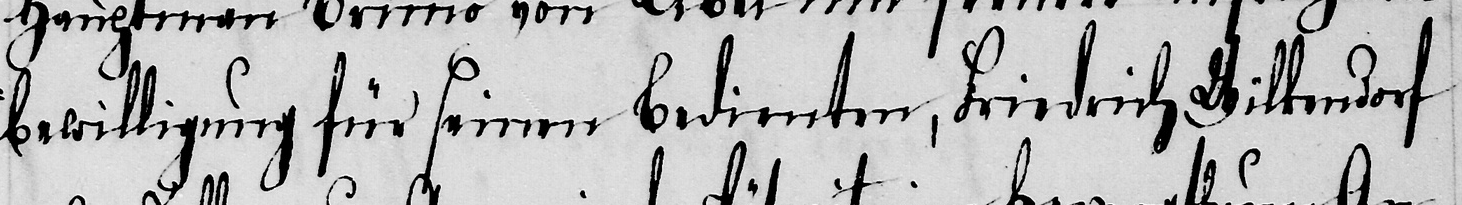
ewilligung für seinen Bedienten, Friedrich Wilkendorf
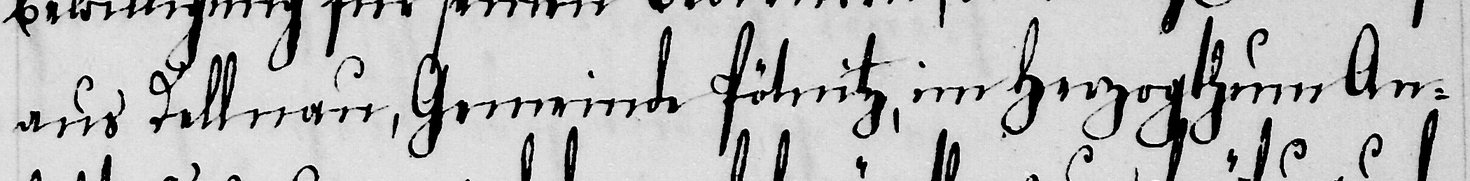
aus Dellnau, Gemeinde Pötnitz, im Herzogthum An¬
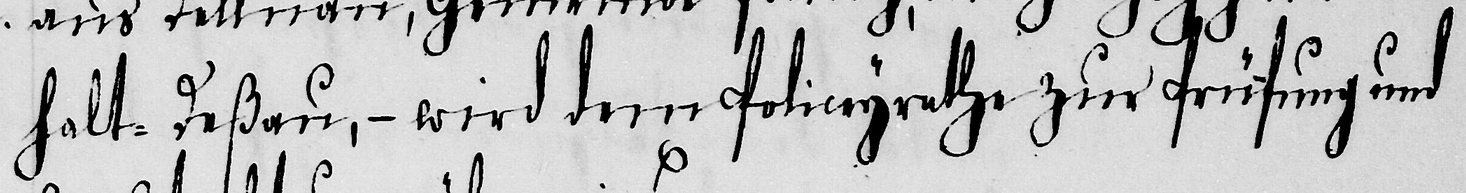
halt-Deßau, – wird dem Policeyrathe zur Prüfung und
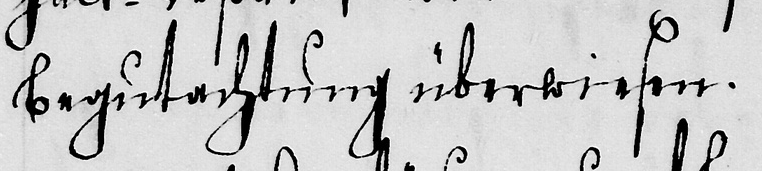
Begutachtung überwiesen.
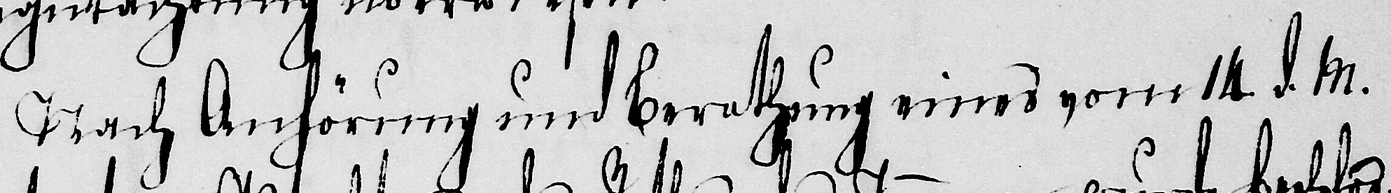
Nach Anhörung und Berathung eines vom 14. d. M.
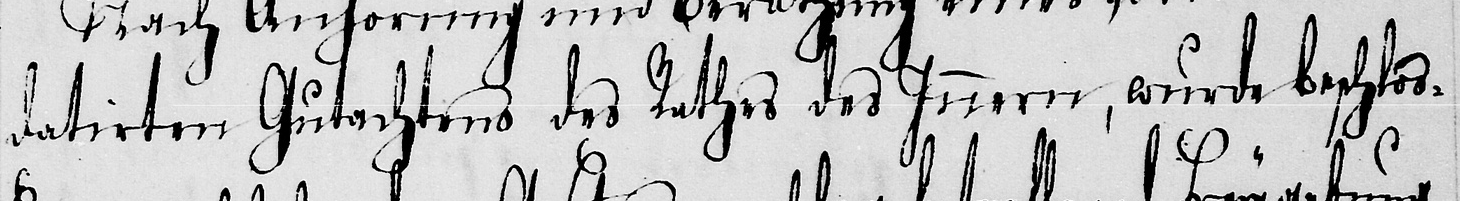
datirten Gutachtens des Rathes des Innern, wurde beschloß¬
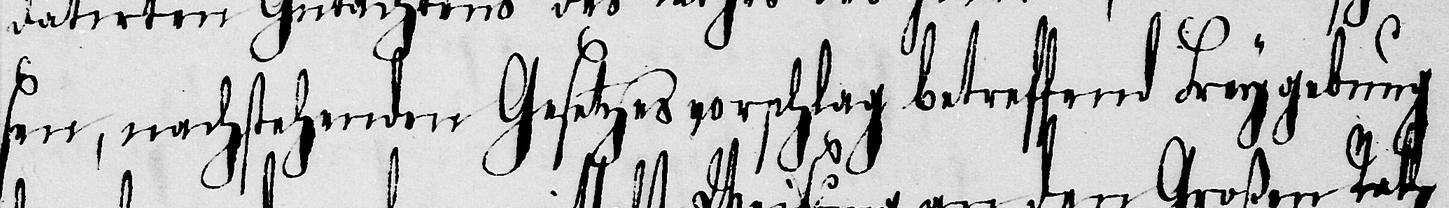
en, nachstehenden Gesetzesvorschlag betreffend Freygebung
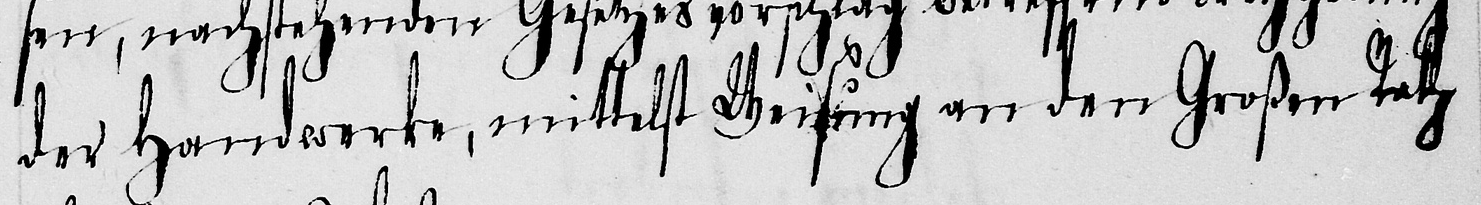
der Handwerke, mittelst Weisung an den Großen Rath
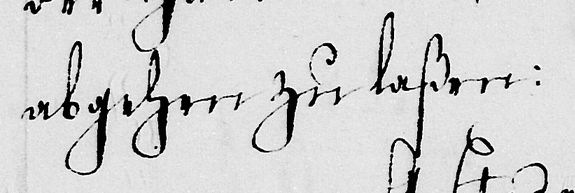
abgehen zu laßen:
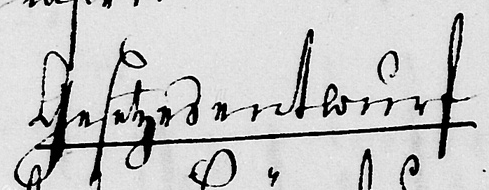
Gesetzesentwurf
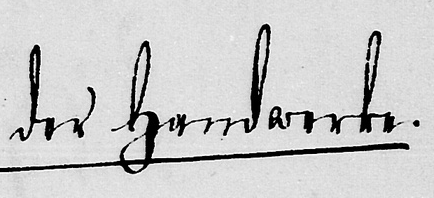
der Handwerke.
